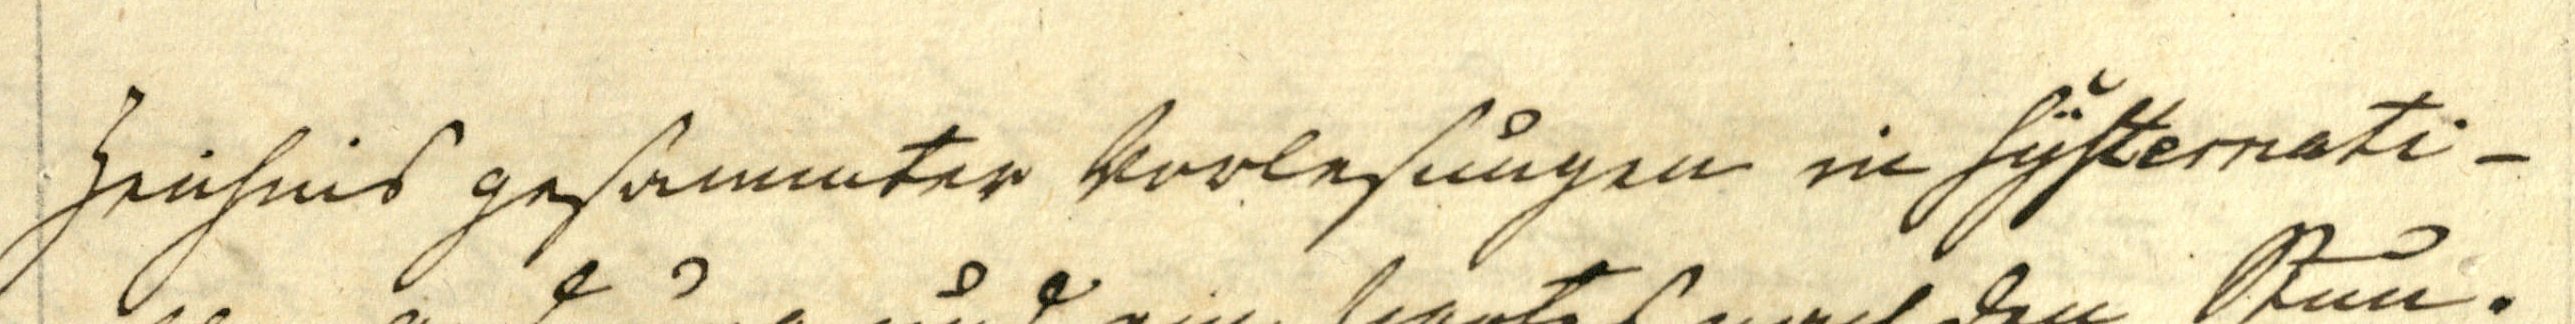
Zeichnis gesammter Vorlesungen in sÿstemati¬
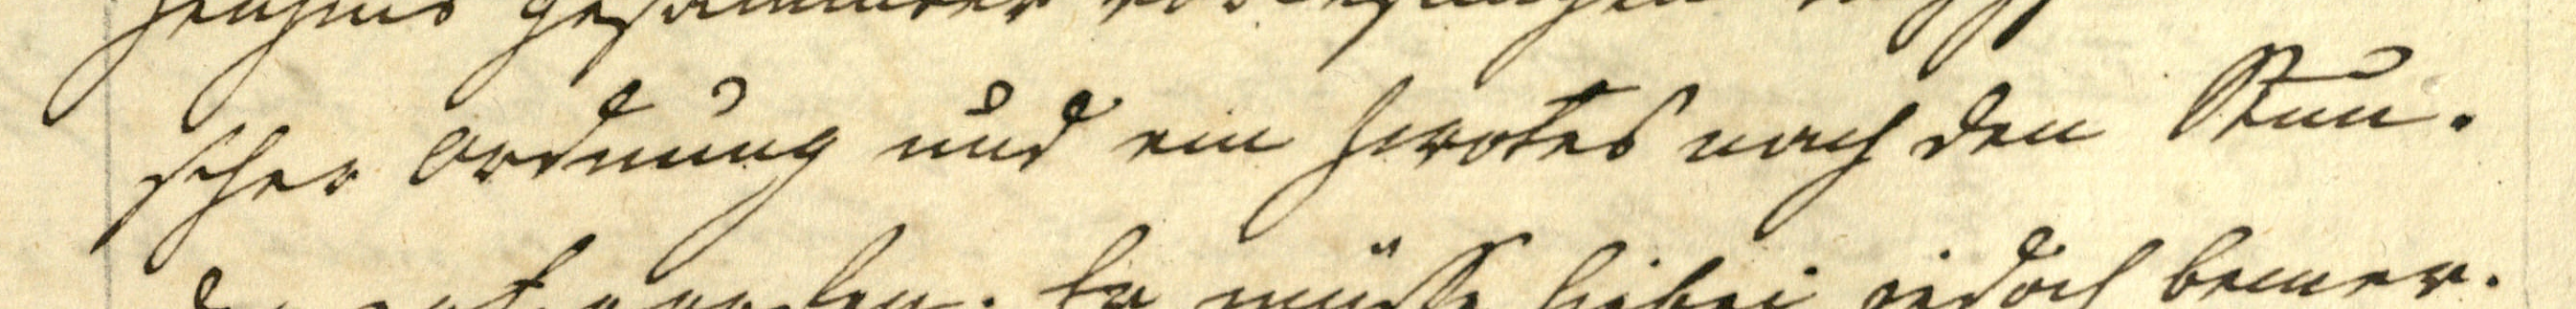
scher Ordnung und ein zwotes nach den Stun¬
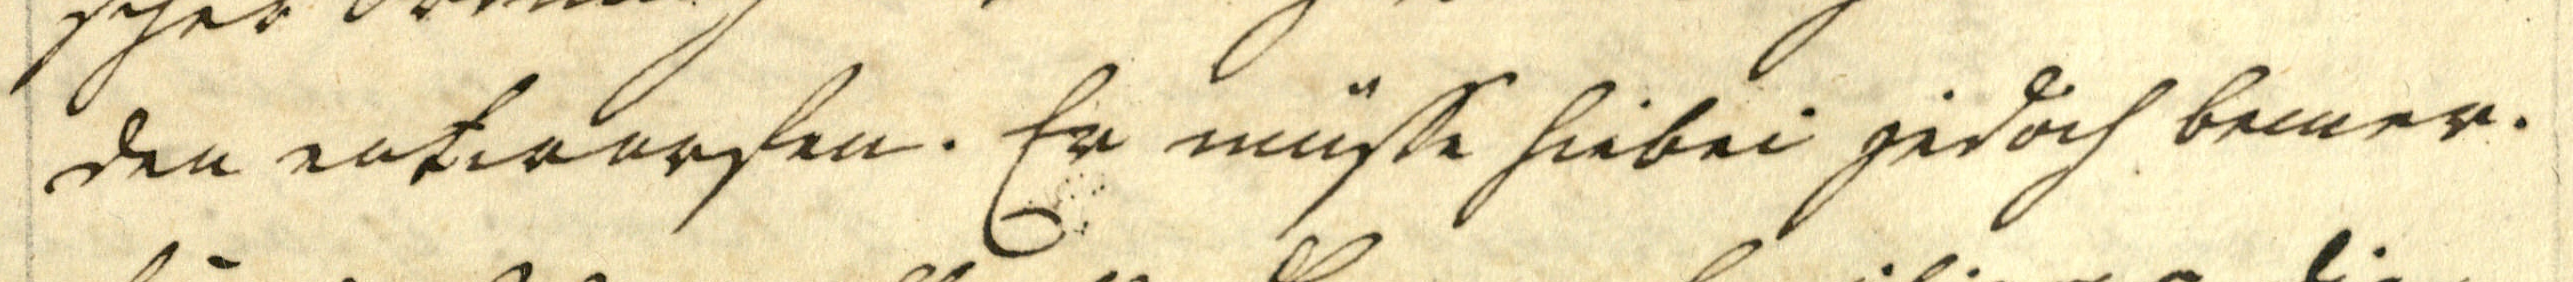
den entworfen. Er müsse hiebei jedoch bemer¬
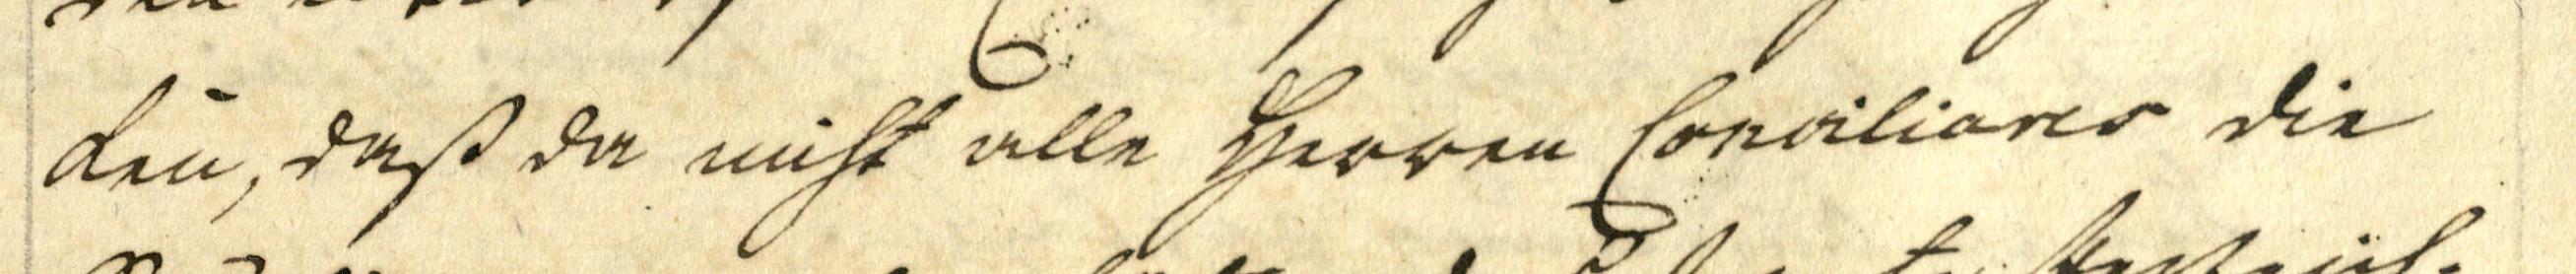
ken, daß da nicht alle Herren Conciliares die
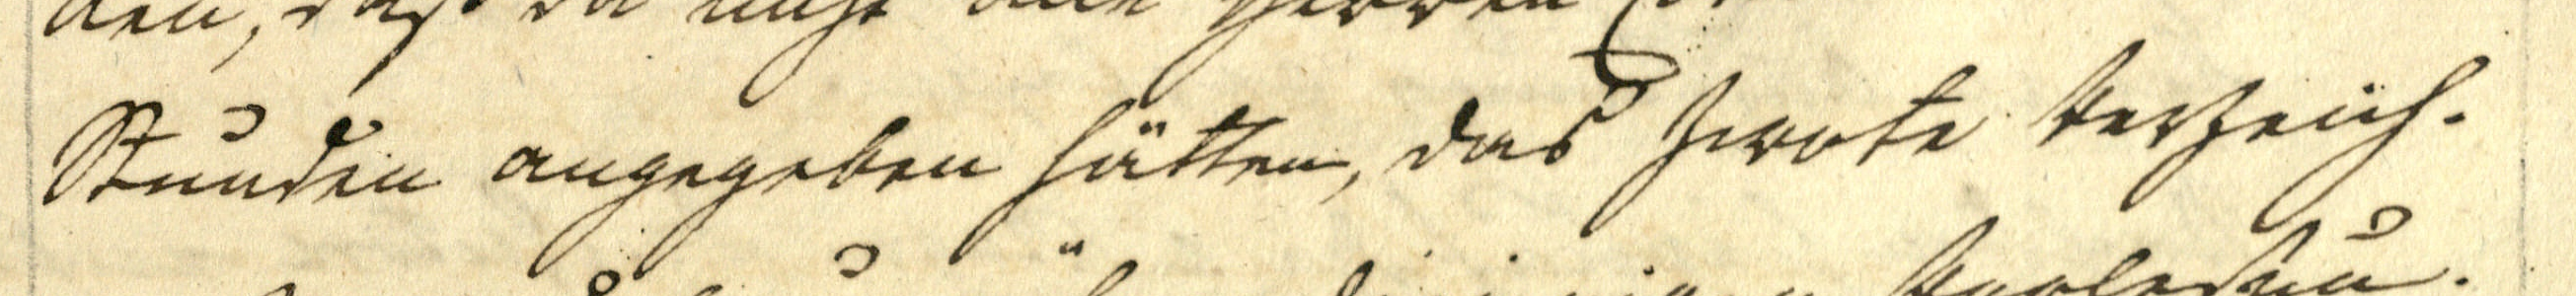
Stunden angegeben hätten, das zwote Verzeich¬
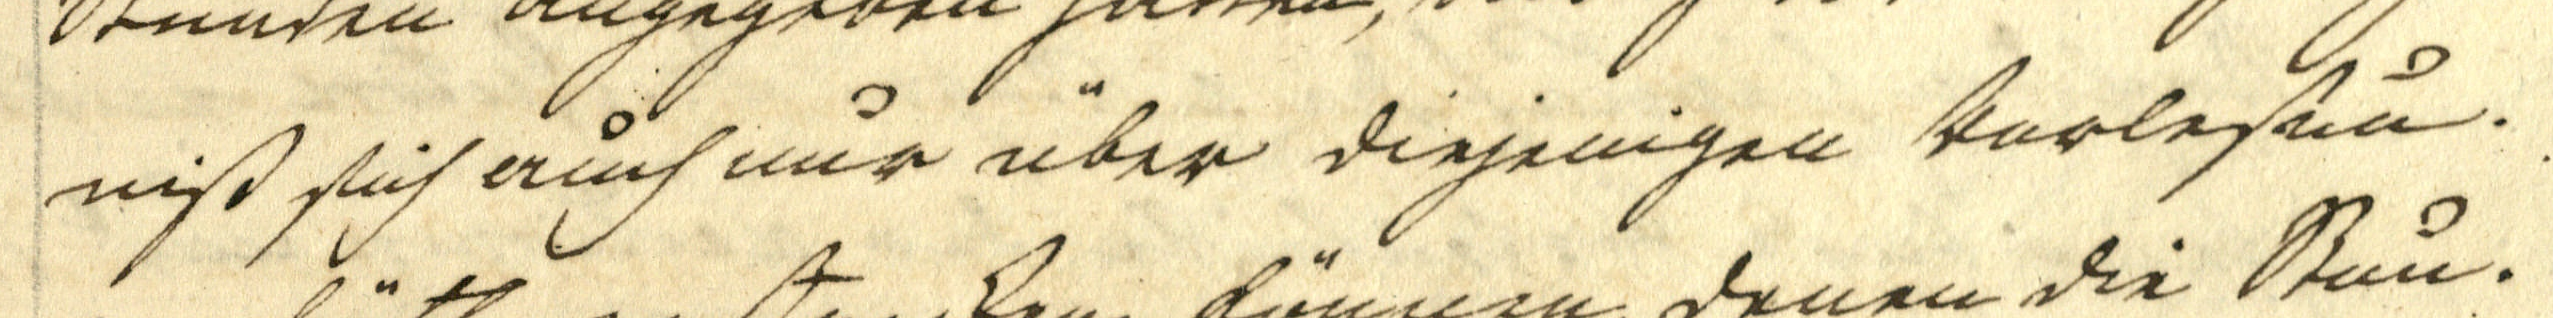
niß sich auch nur über diejenigen Vorlesun¬
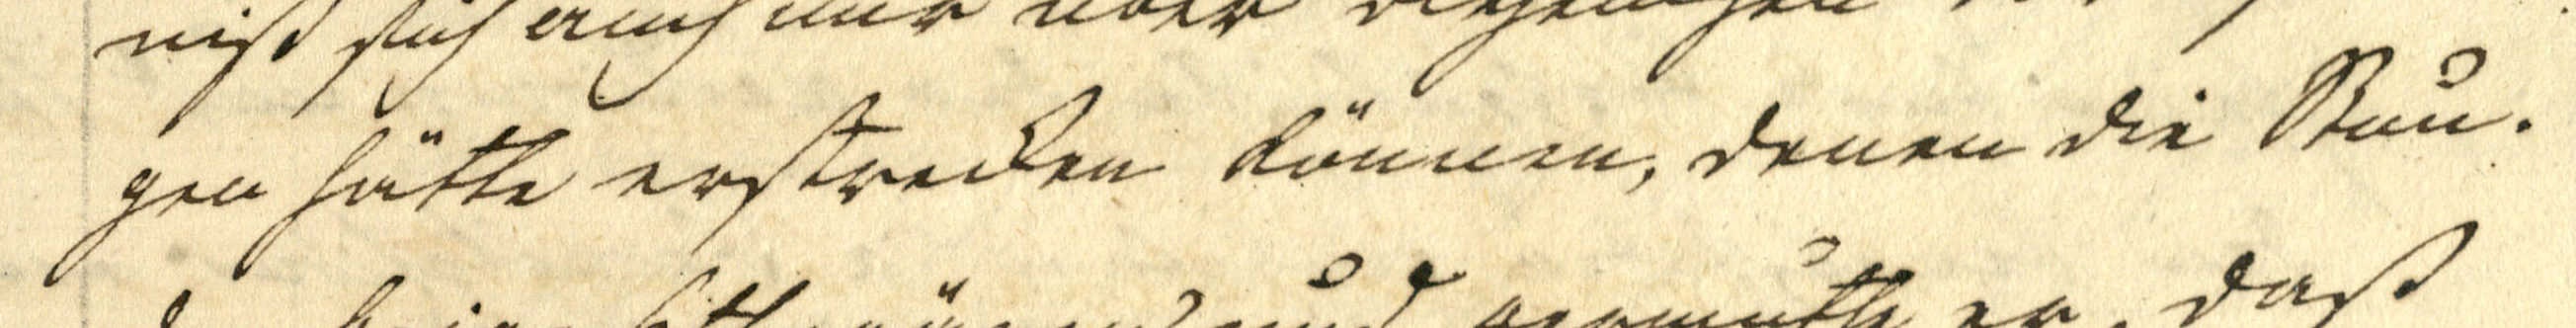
gen hätte erstrecken können, denen die Stun¬
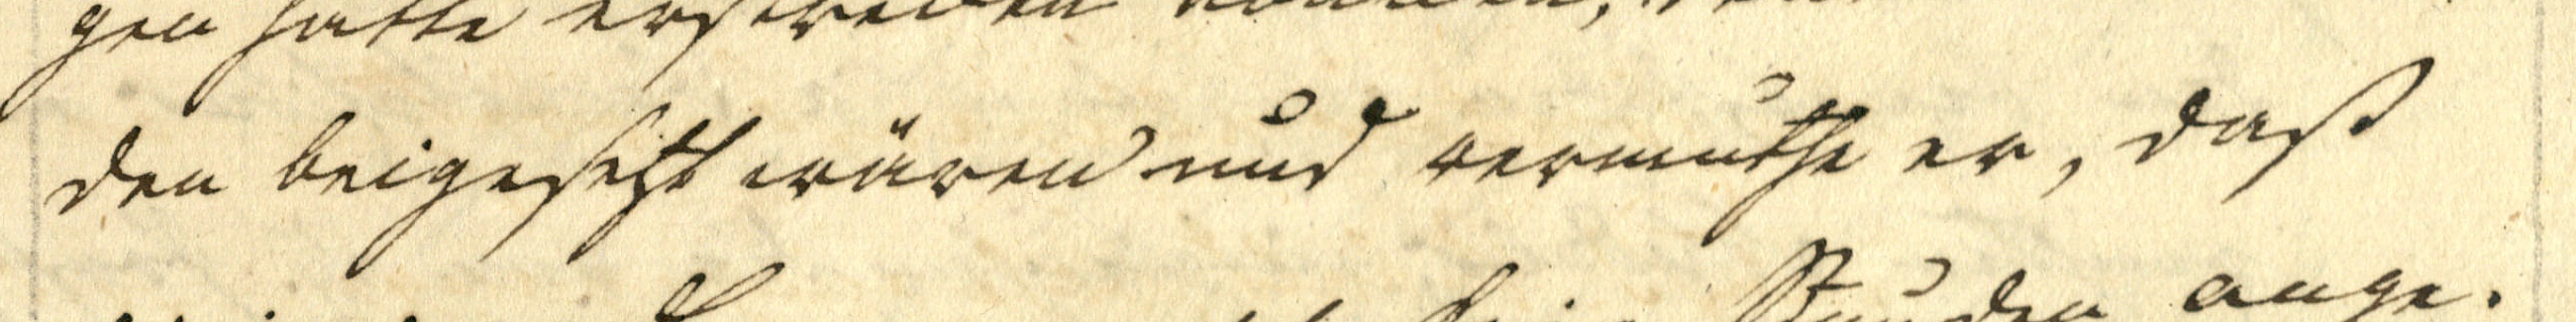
den beigesetzt wären und vermuthe er, daß
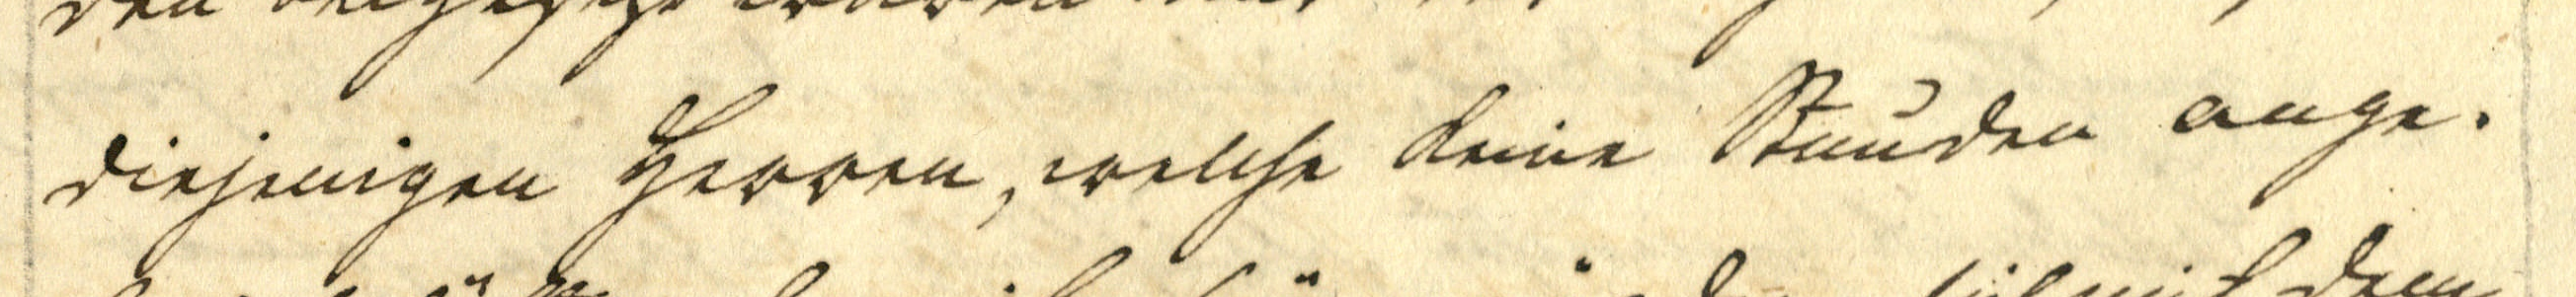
diejenigen Herren, welche keine Stunden ange¬
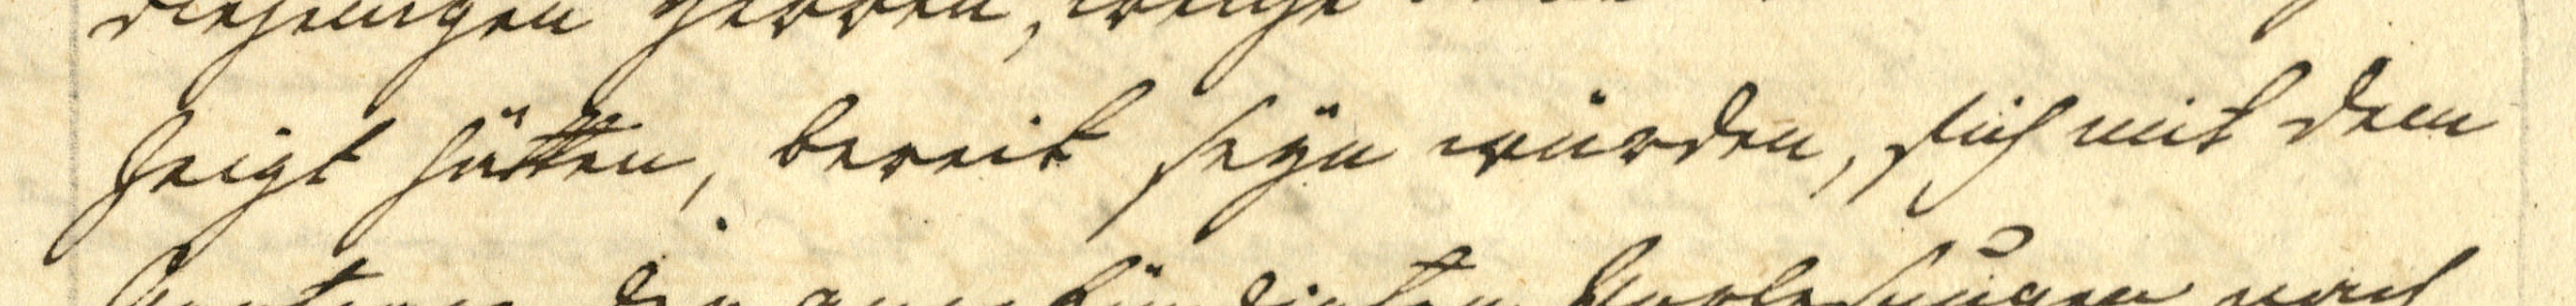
zeigt hätten, bereit seÿn würden, sich mit dem
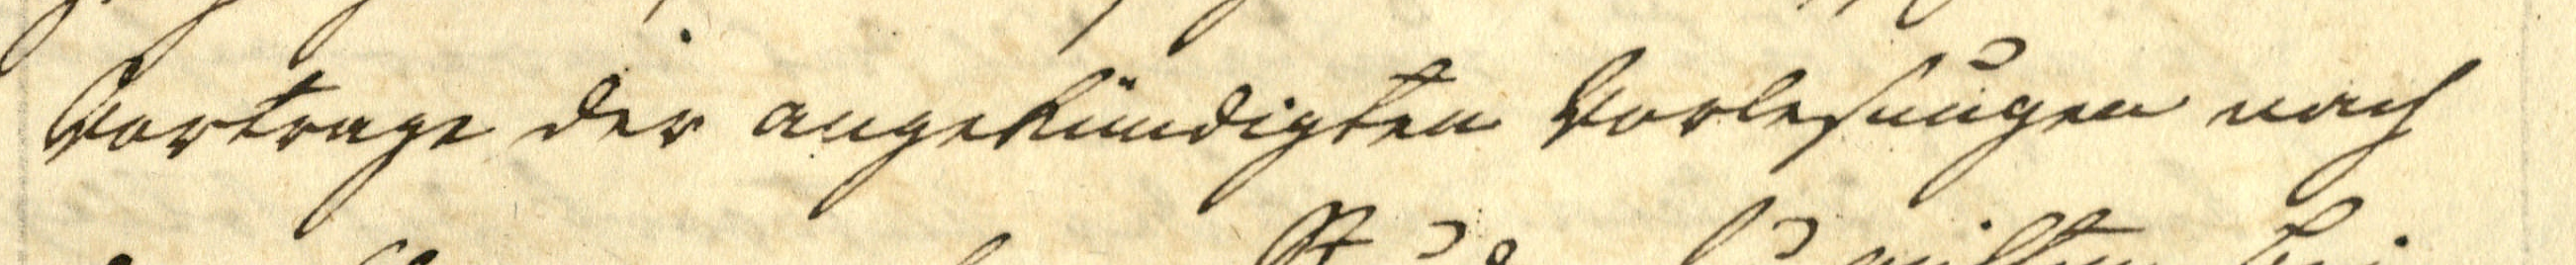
Vortrage der angekündigten Vorlesungen nach
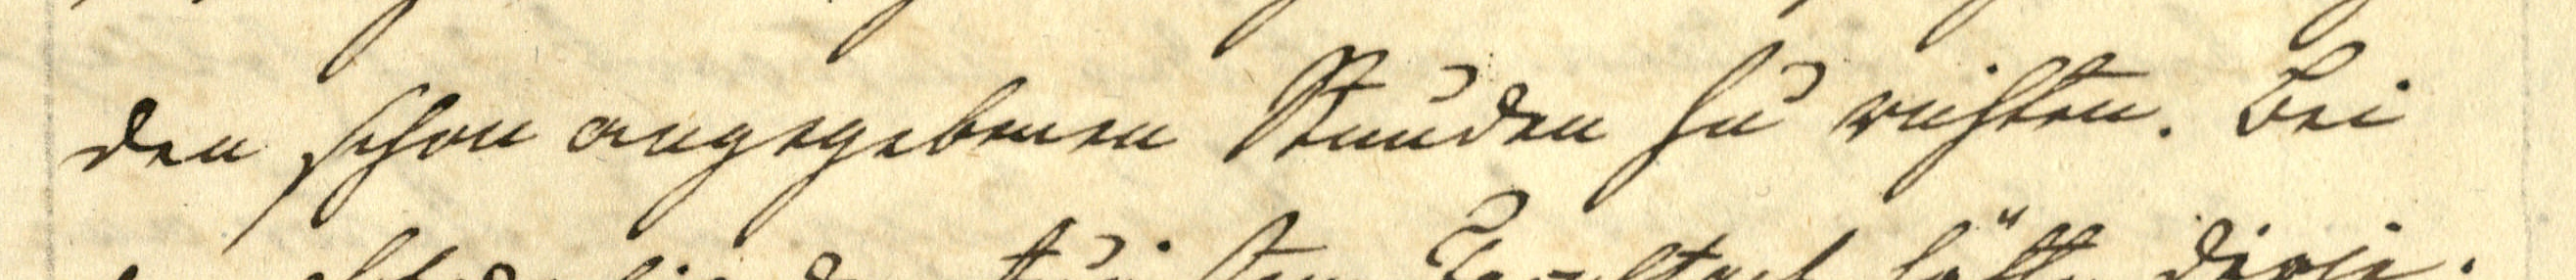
den schon angegebenen Stunden zu richten. Bei
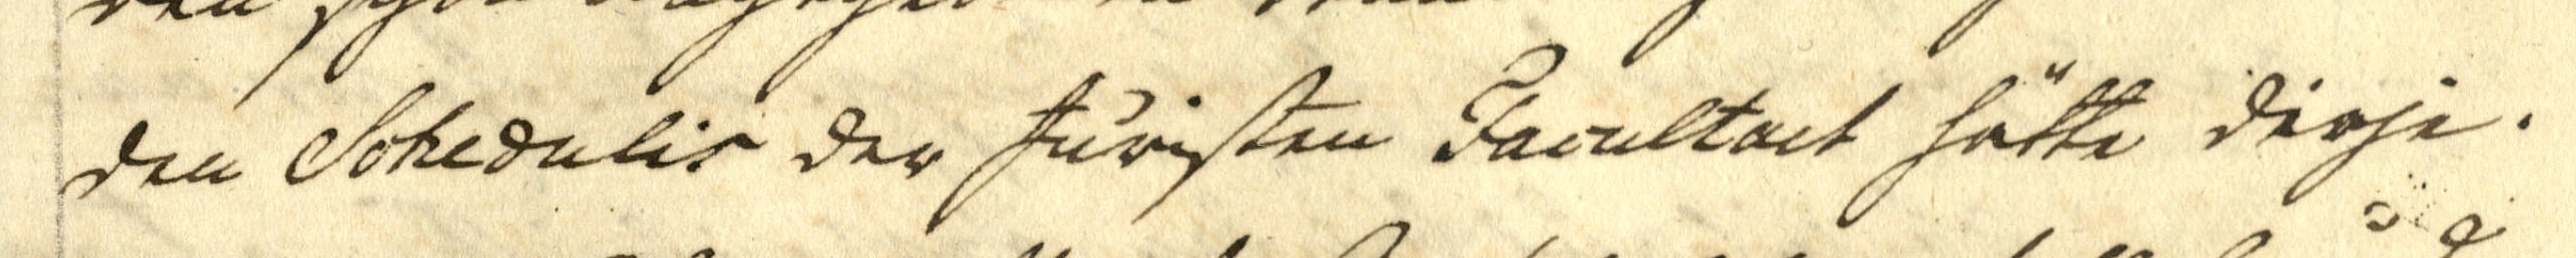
den Schedulis der Juristen Facultaet hätte derje¬
